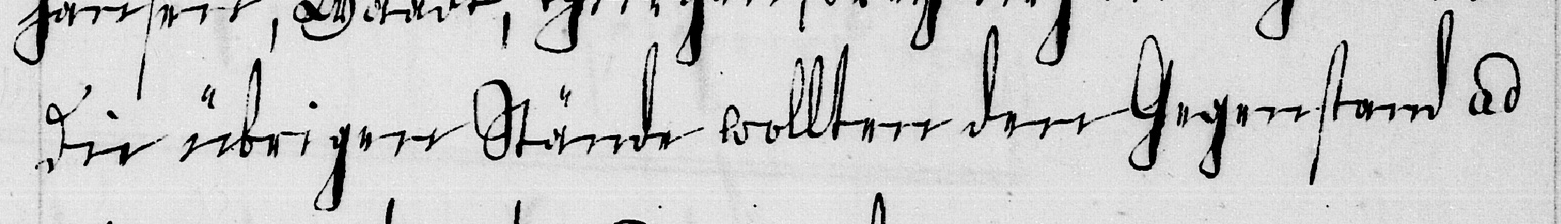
Die übrigen Stände wollten den Gegenstand ad
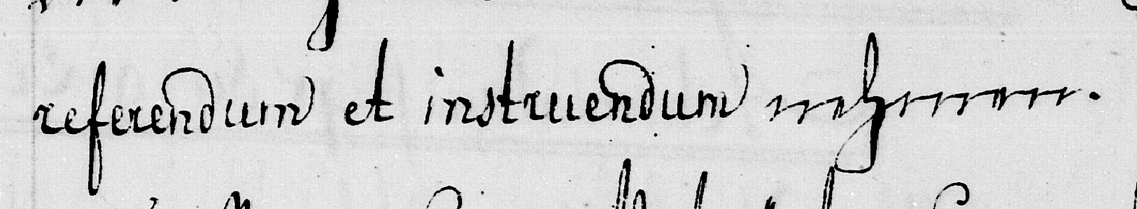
referedum et instruendum machen.
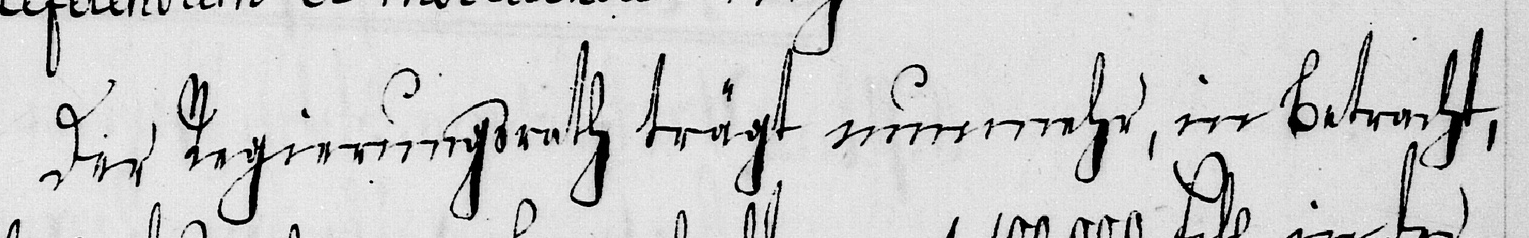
Der Regierungsrath trägt nunmehr, in Betracht,
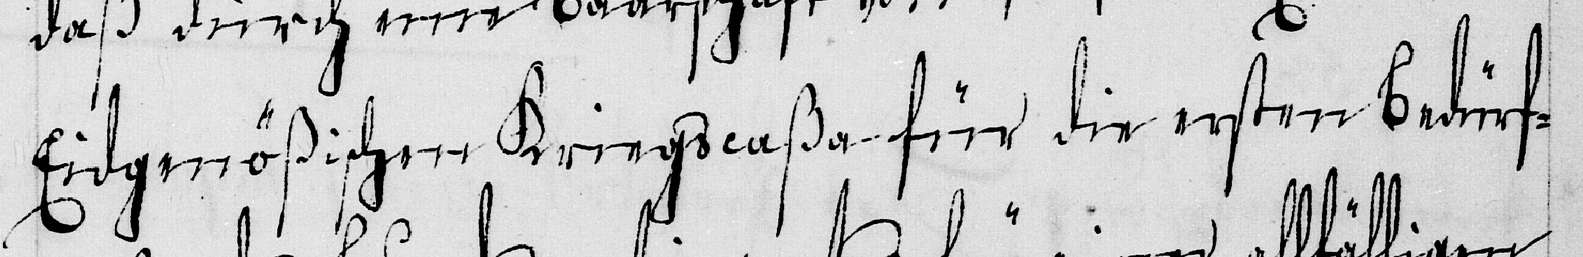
Eidgenößischen Kriegscaßa für die ersten Bedürf¬
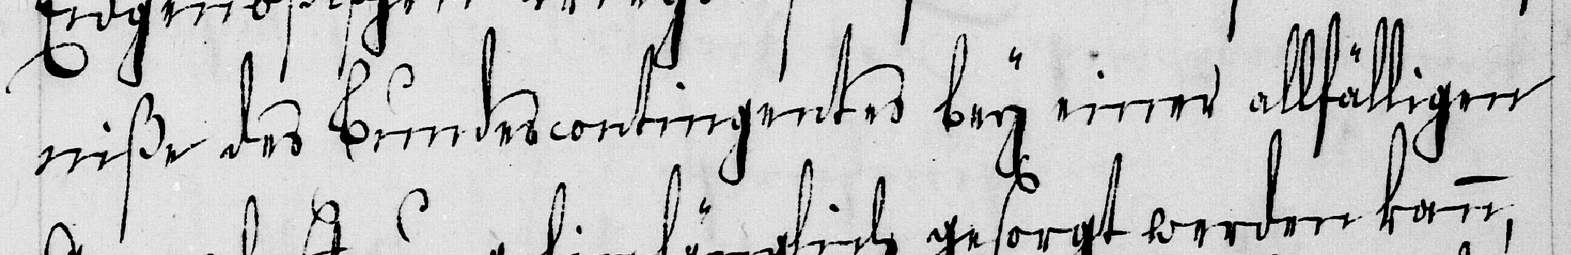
niße des Bundescontigentes bey einer allfälligen
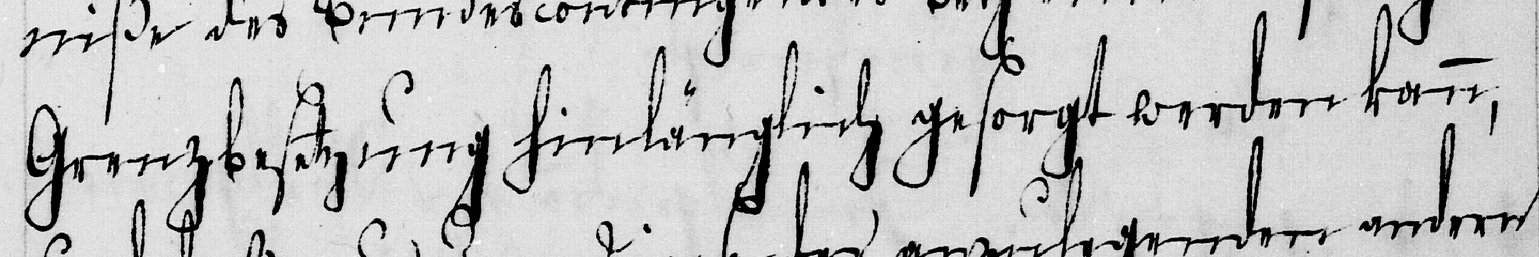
Grenzbesetzung hinlänglich gesorgt werden kann,
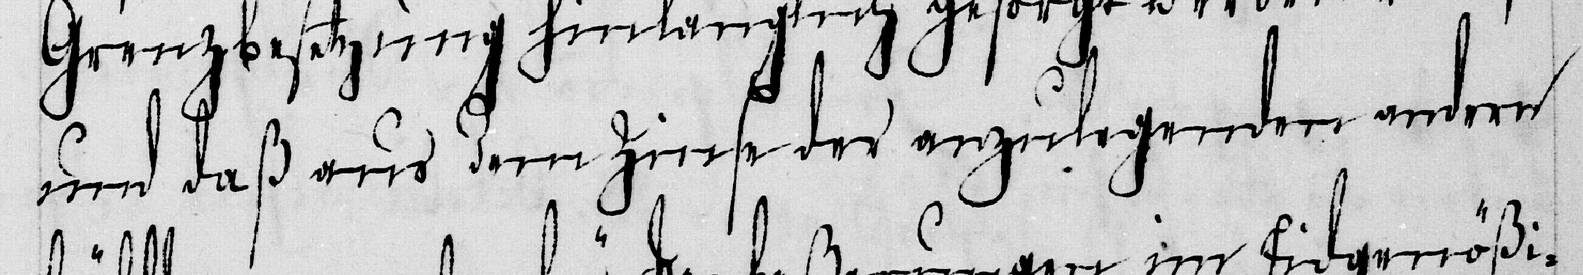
und daß aus dem Zinse der anzulegenden andern
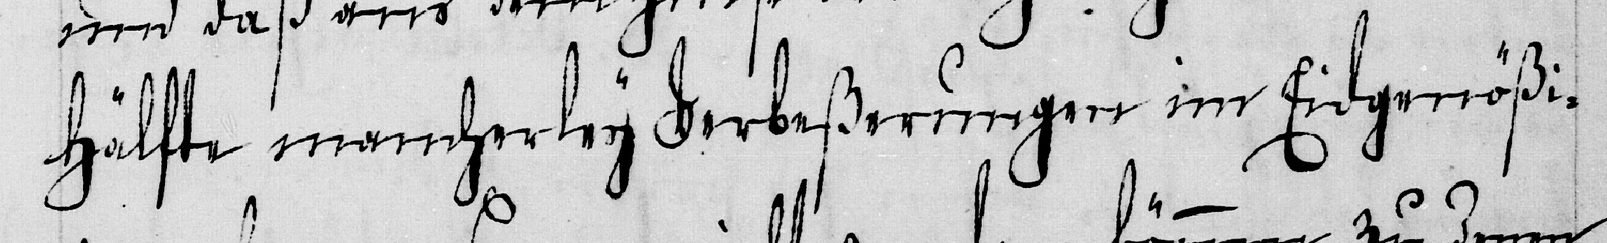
Hälfte mancherley Verbeßerungen im Eidgenößi¬
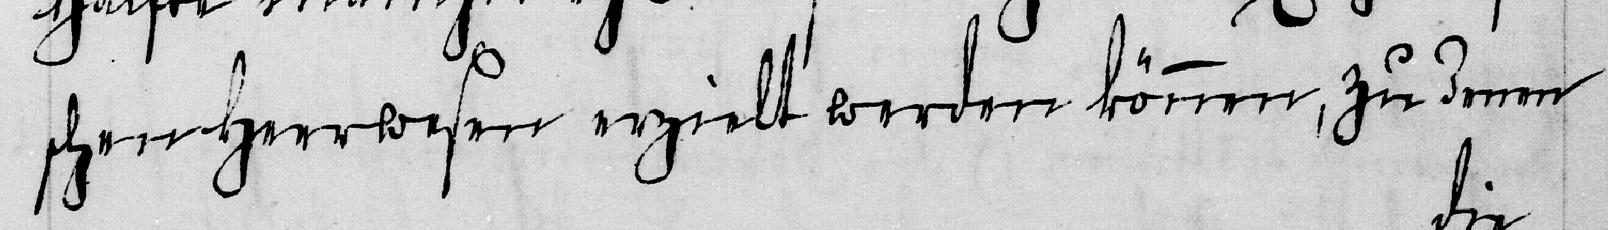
schen Heerwesen erzielt werden können, zu denen
